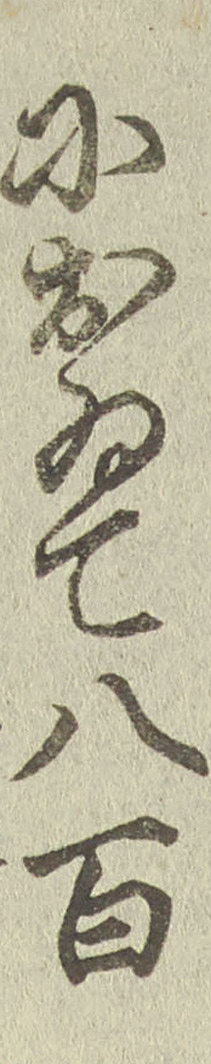におゐて八百
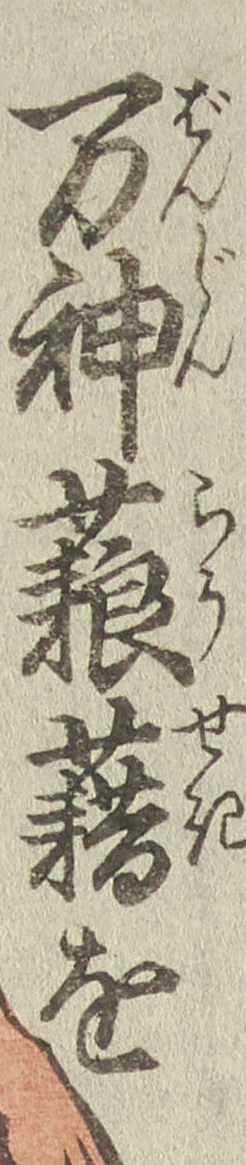万神狼藉を
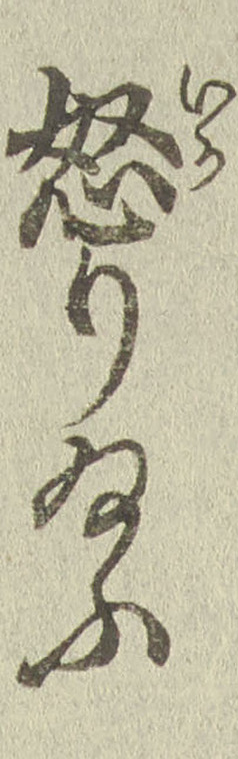怒り給ふ
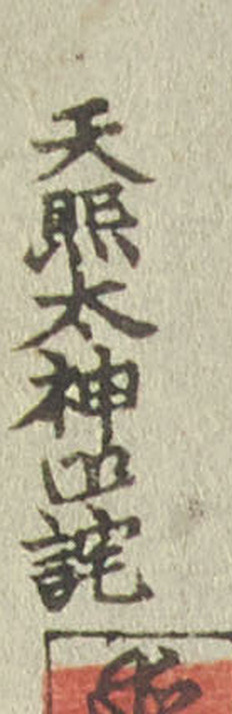天照太神御詫
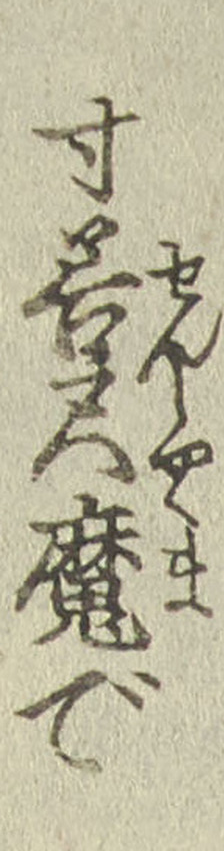寸善尺魔で
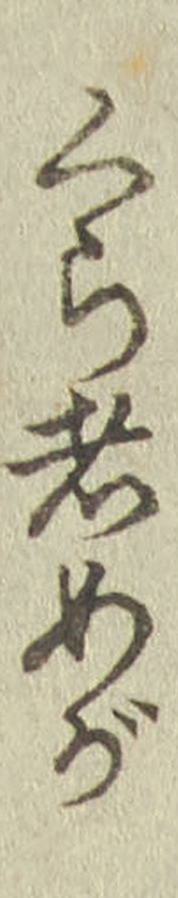くら者めが
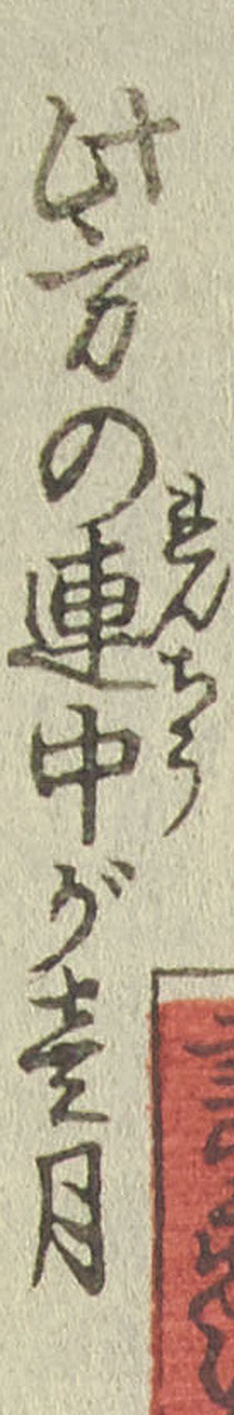此方の連中が壹月
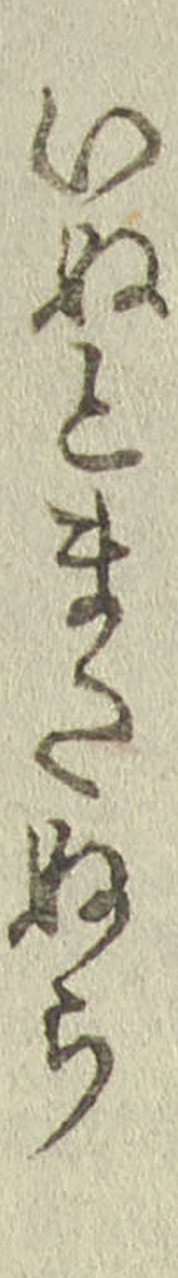いぬとまたぬら
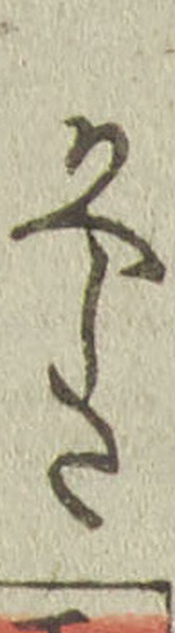かへした
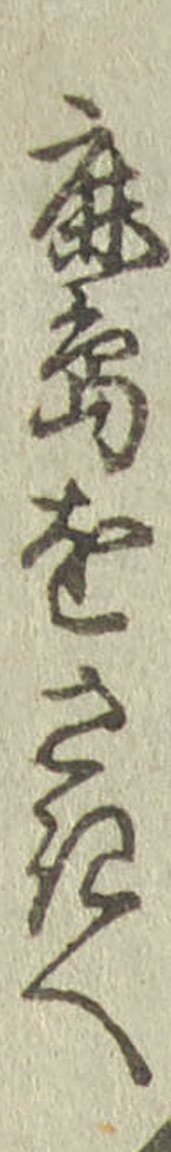鹿島をさきへ
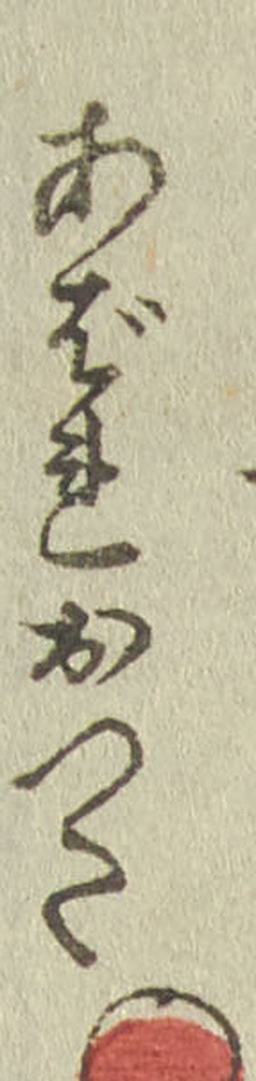あばれおつた
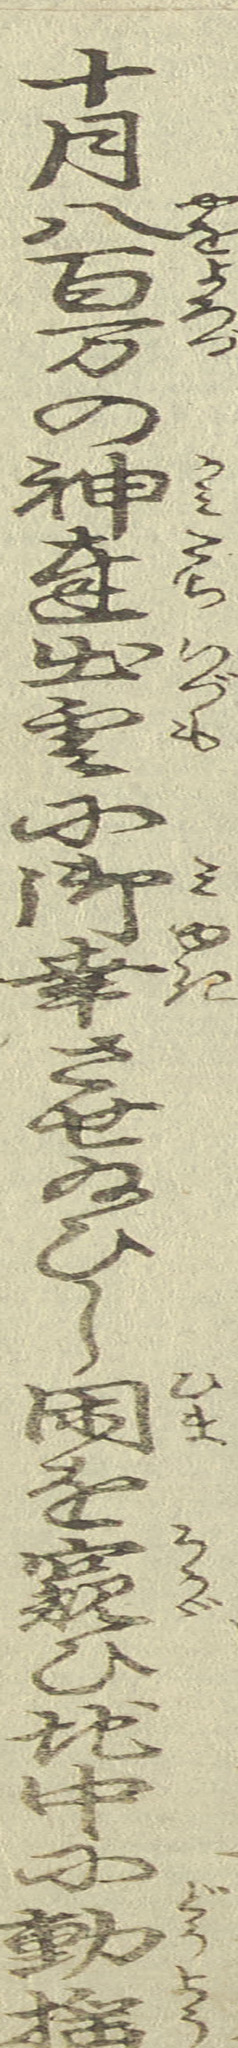十月八百万の神達出雲に御幸させ給ひし閑を窺ひ地中に動揺
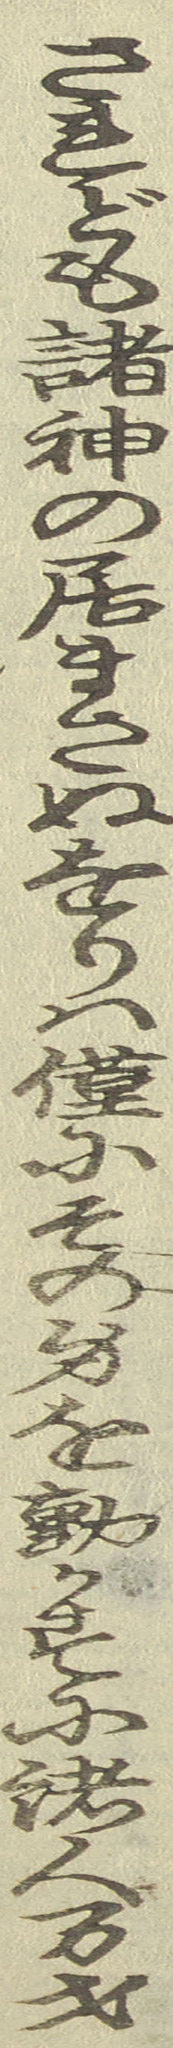されども諸神の居まさぬをりは僅にその身を動かすに諸人万才
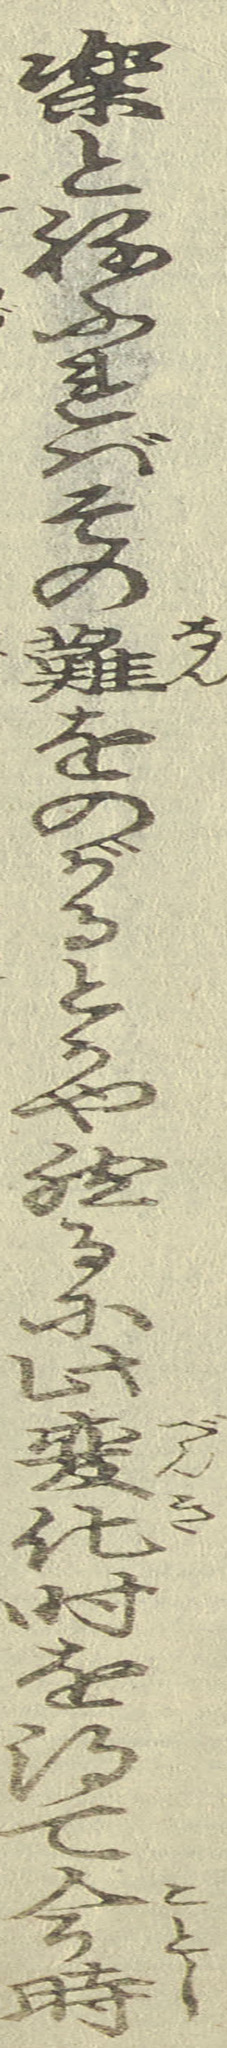楽と称ふればその難をのがるとかや然るに此変化時を得て今時
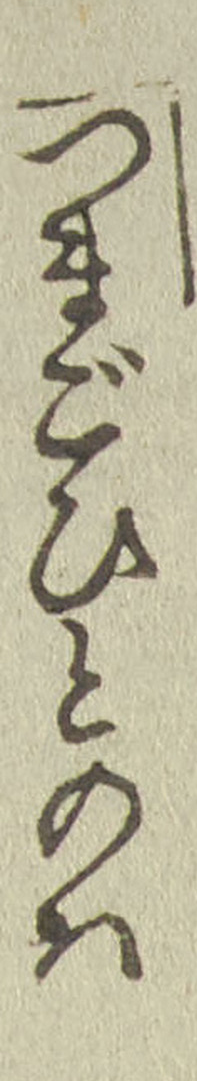〽つまごひとのは
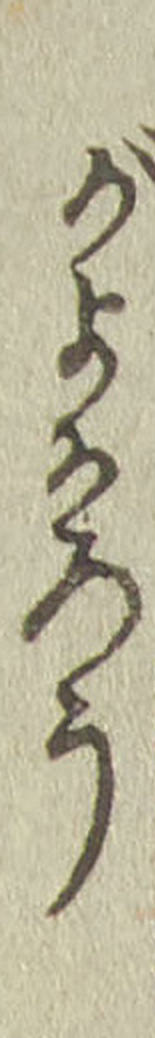がよかろう
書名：上方震下り瓢磐鯰の化物 一名難獣といふ
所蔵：東京大学総合図書館 General Library in the University of Tokyo, JAPAN
